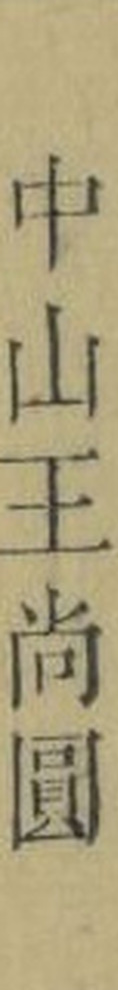中山王尚円
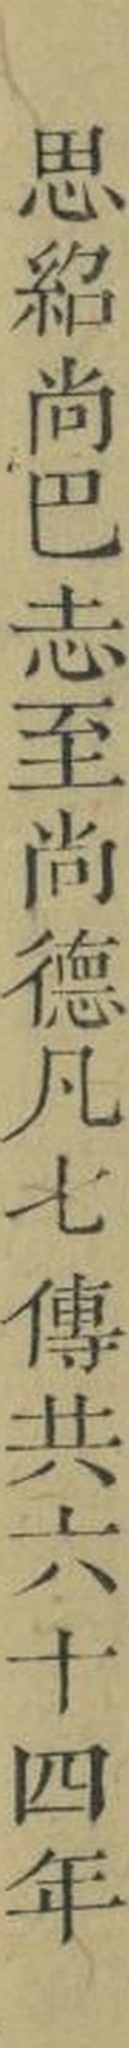思紹尚巴志至尚徳凡七伝共六十四年
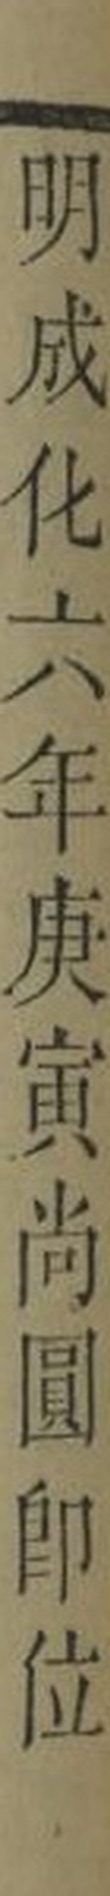明成化六年庚寅尚円即位
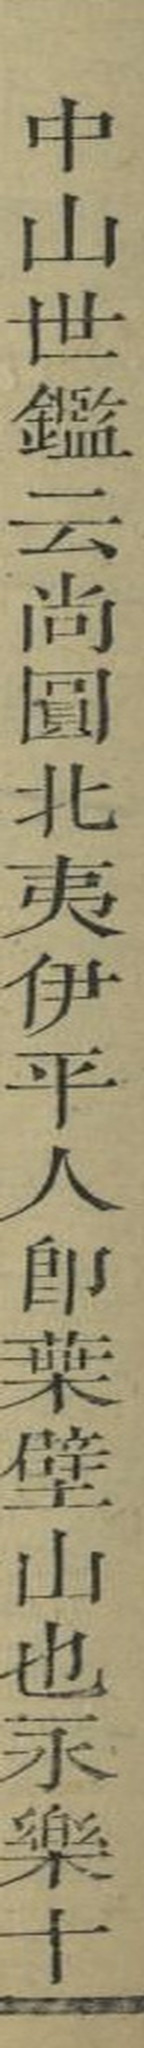中山世鑑云尚円北夷伊平人即葉壁山也永楽十
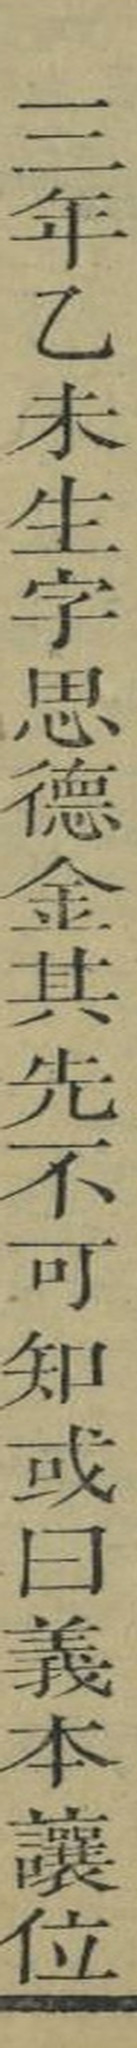三年乙未生字思徳金其先不可知或曰義本譲位
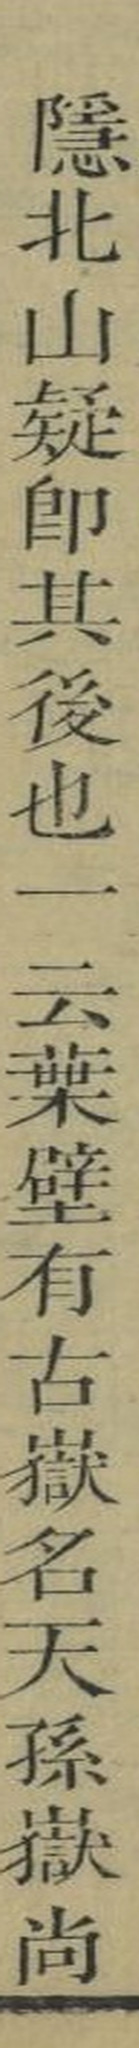隠北山疑即其後也一云葉壁有古岳名天孫岳尚
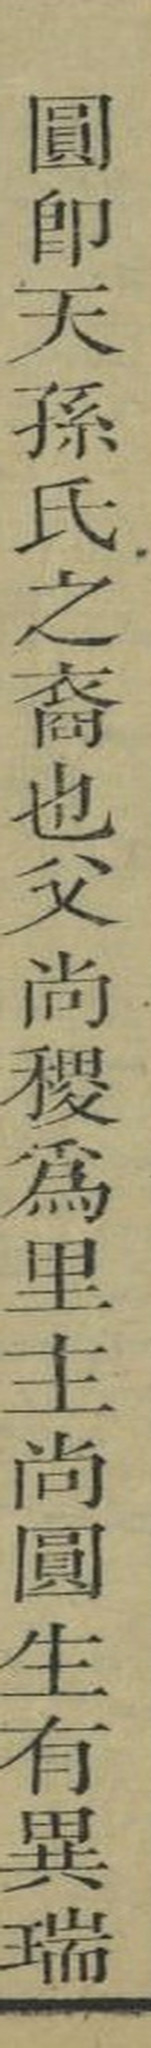円即天孫氏之裔也父尚稷為里主尚円生有異瑞
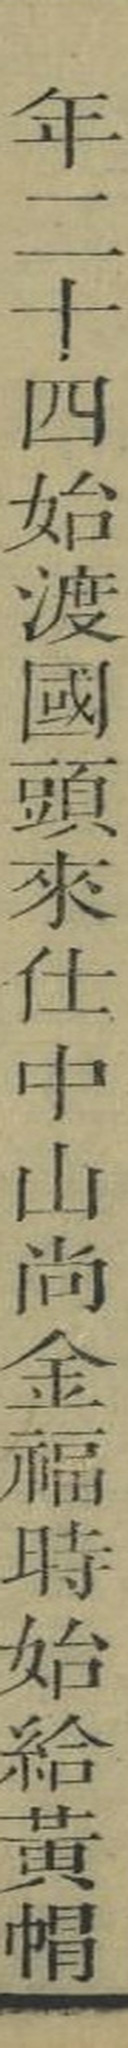年二十四始渡国頭来仕中山尚金福時始給黄帽
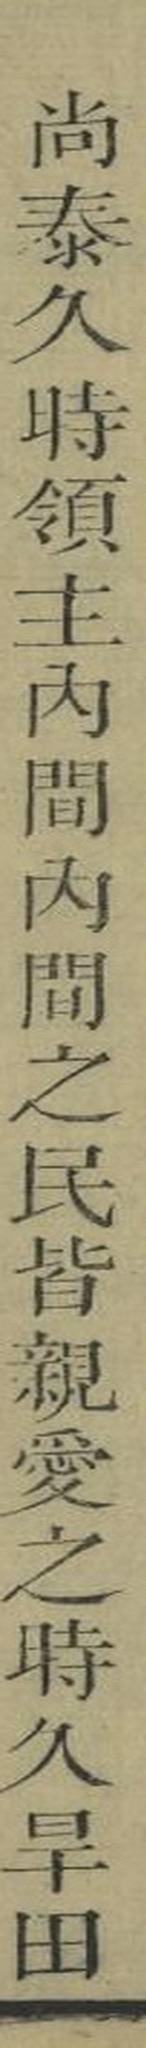尚泰久時領主内間内間之民皆親愛之時久旱田
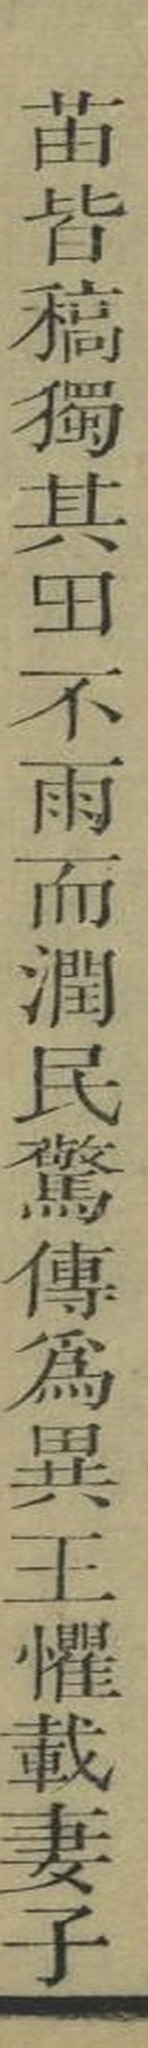苗皆稿独其田不雨而潤民驚伝為異王懼載妻子
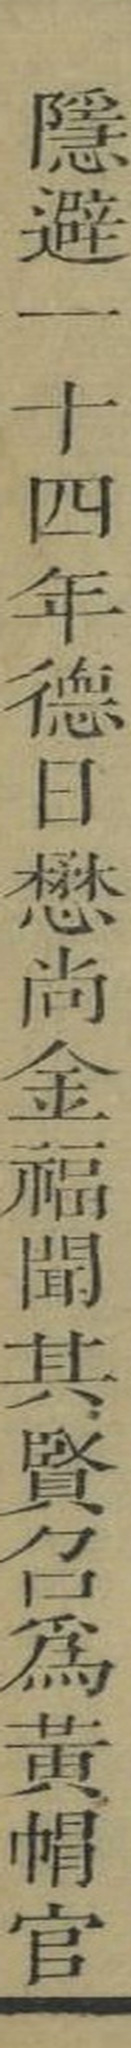隠避一十四年徳日懋尚金福聞其賢召為黄帽官

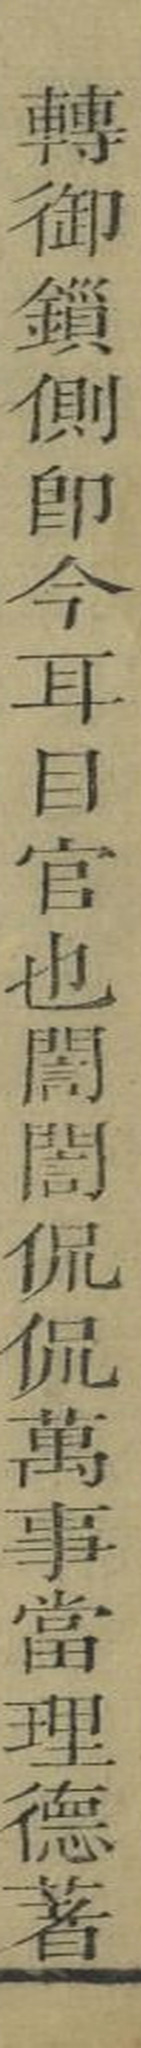転御鎖側即今耳目官也誾誾侃侃万事当理徳著
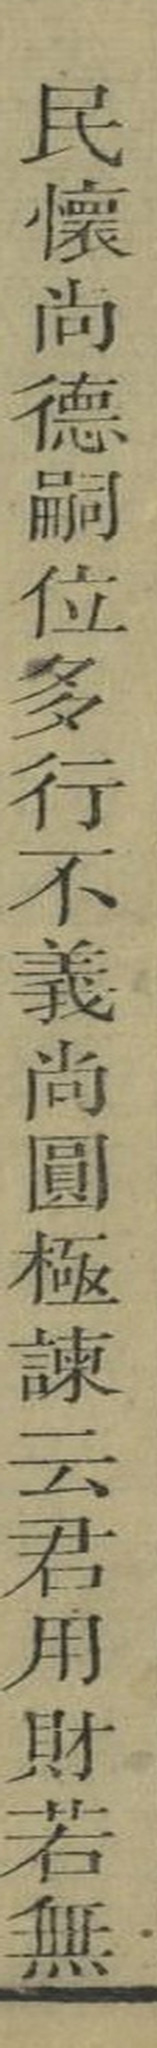民懐尚徳嗣位多行不義尚円極諫云君用財若無
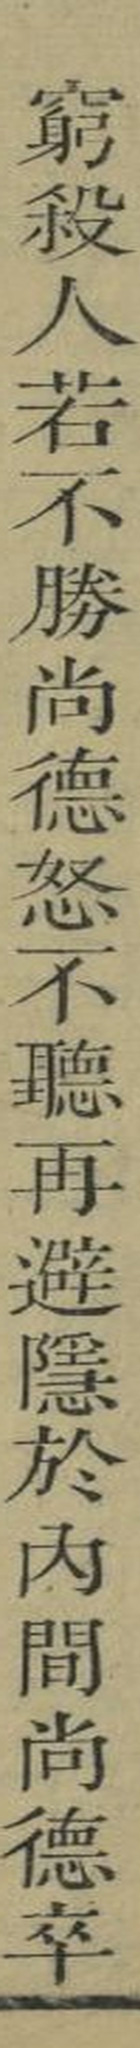窮殺人若不勝尚徳怒不聴再避隠於内間尚徳卒
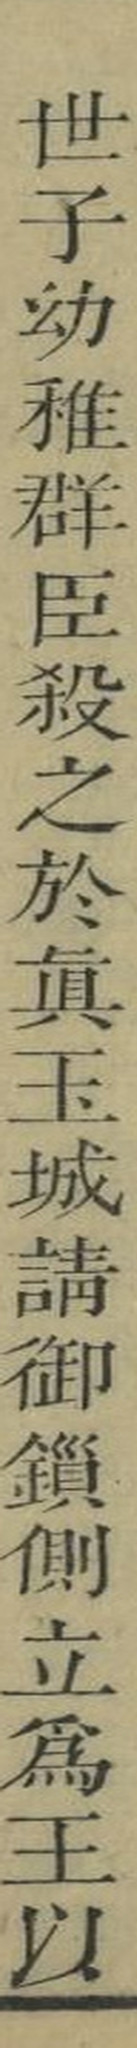世子幼稚群臣殺之於真玉城請御鎖側立為王以
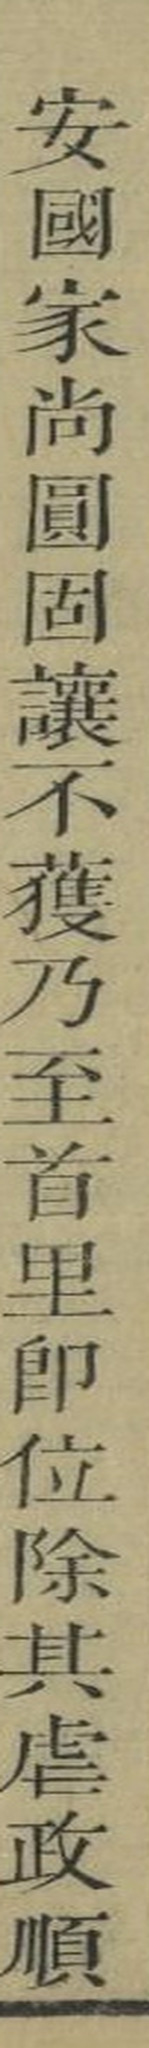安国家尚円固譲不獲乃至首里即位除其虐政順
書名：中山伝信録 巻三
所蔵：University of the Ryukyus Library
